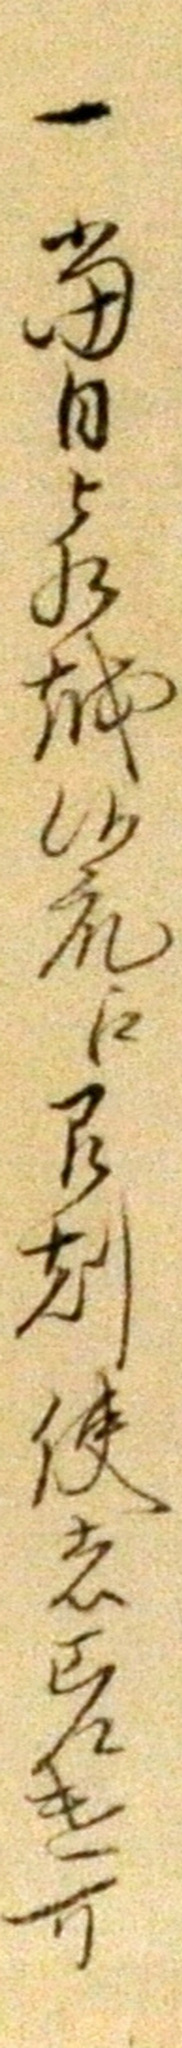一当日被相越候衆江即刻使者差遣可
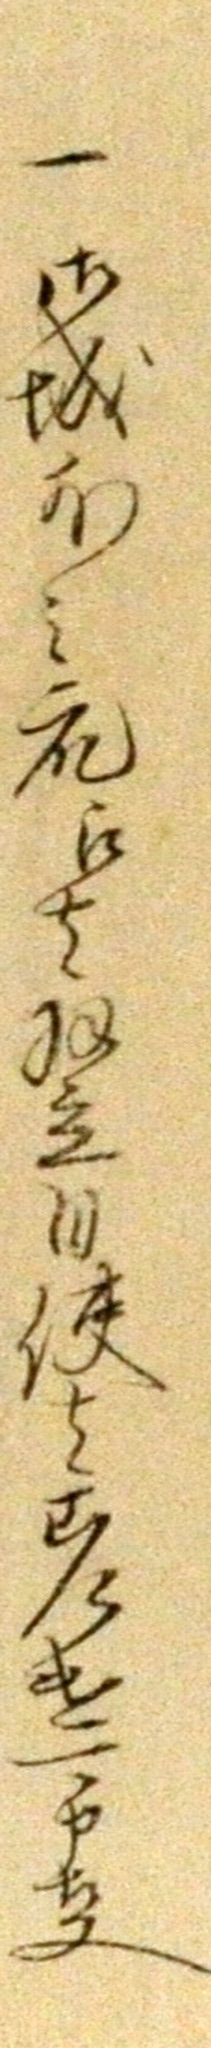一御城外之衆江者翌日使者差遣可申事
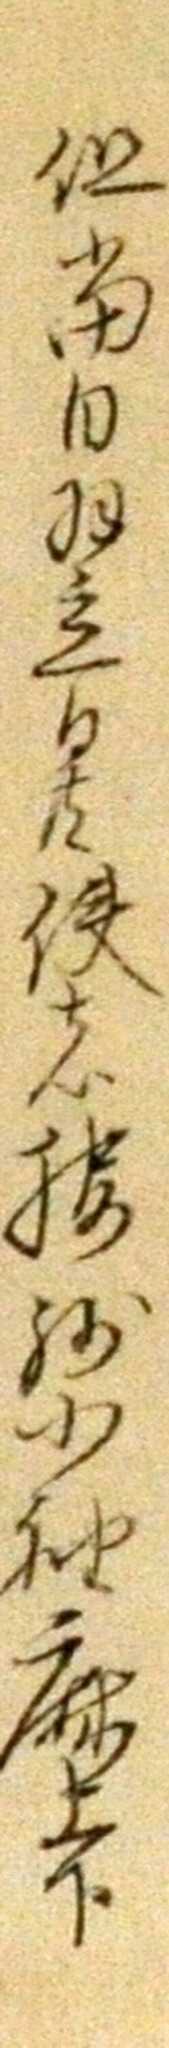但当日翌日共使者服紗小袖麻上下
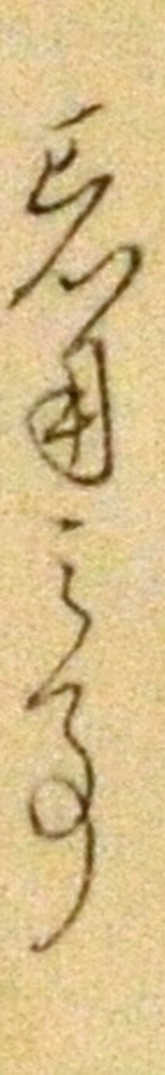着用之事
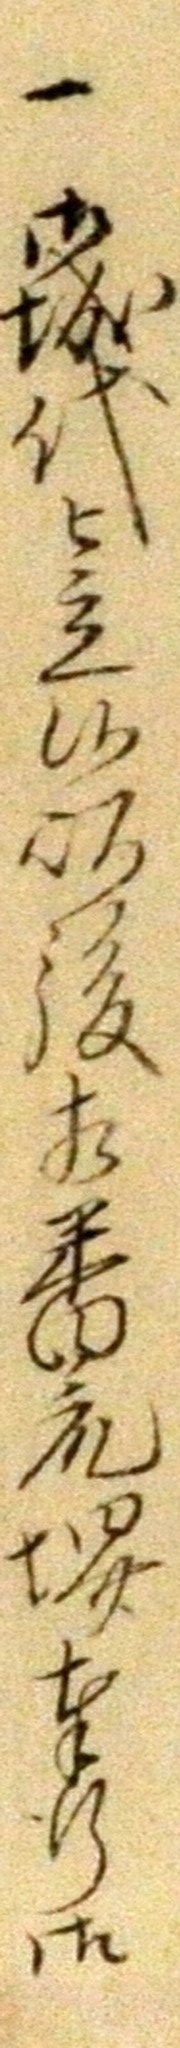一御城代被立候以後相番衆堺奉行御
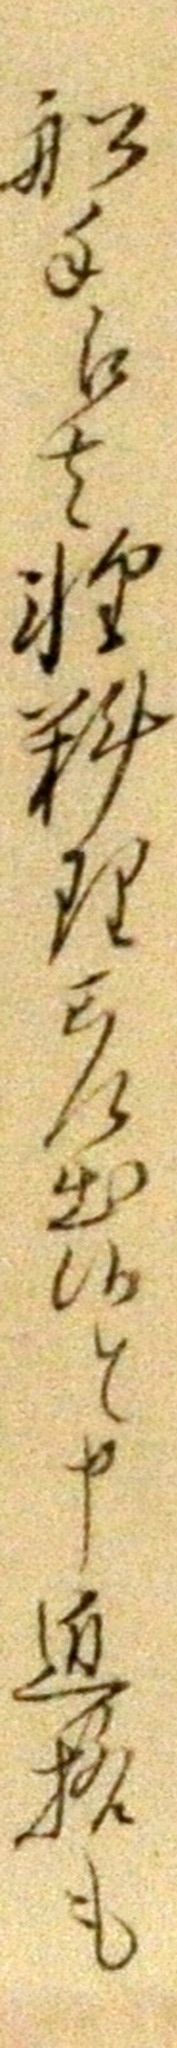船手江者軽料理差出候と申近格も
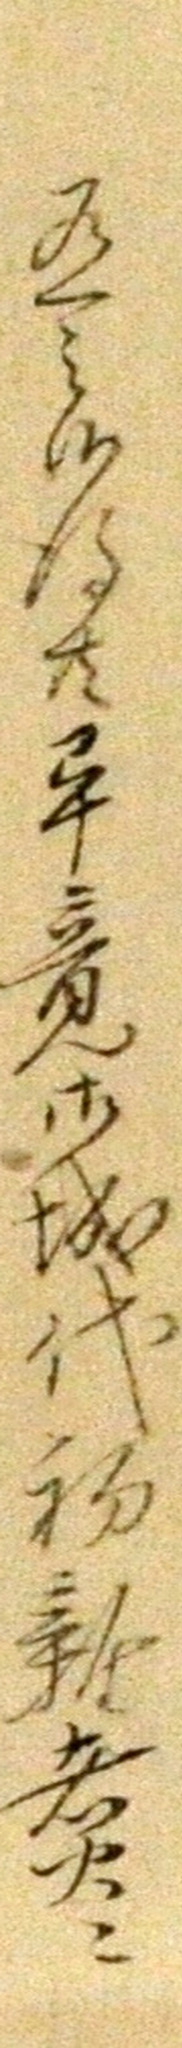有之候得共畢竟御城代初雑煮ニ
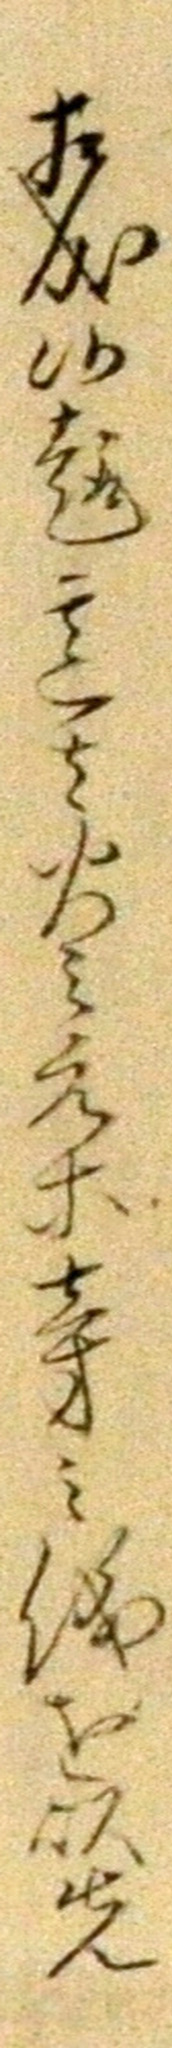相成候趣意者火之元等旁之儀を以先
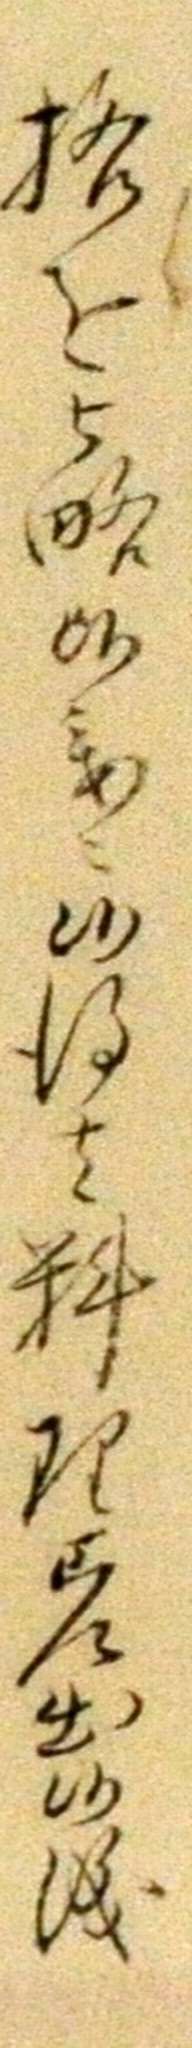格を被略候義ニ候得者料理差出候儀
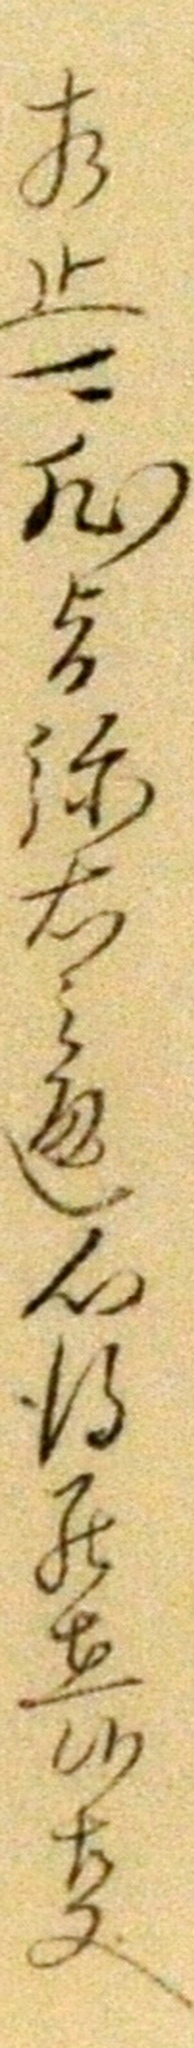相止可然旨弥右之通心得罷在候事
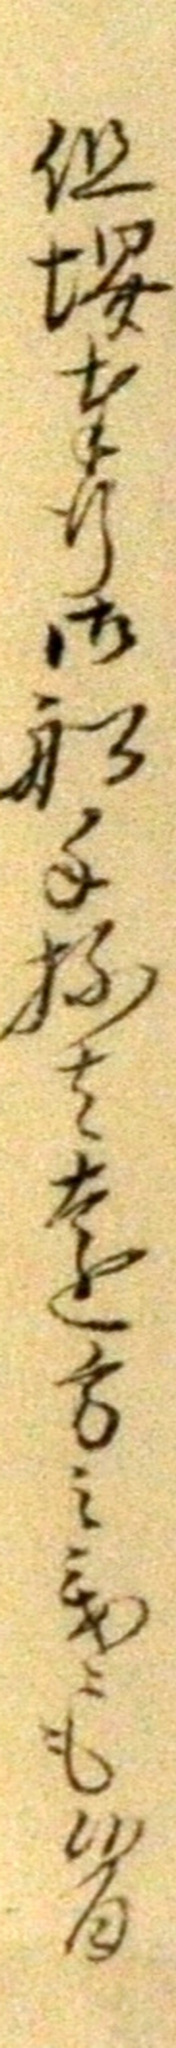但堺奉行御船手抔者遠方之義ニも候間

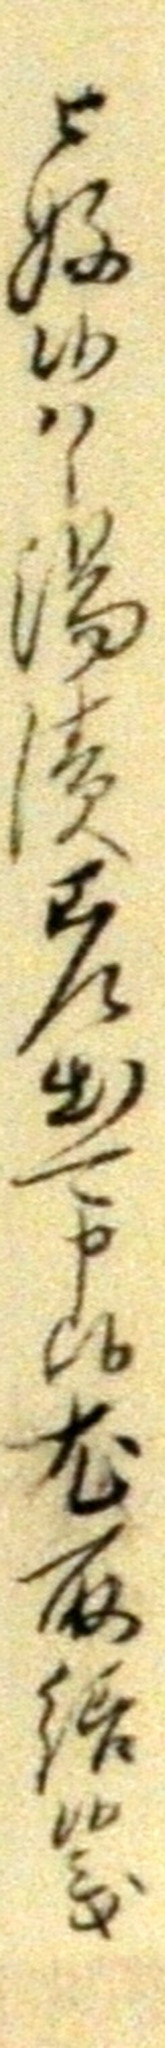被好候ハヽ湯漬差出可申候尤取繕候義
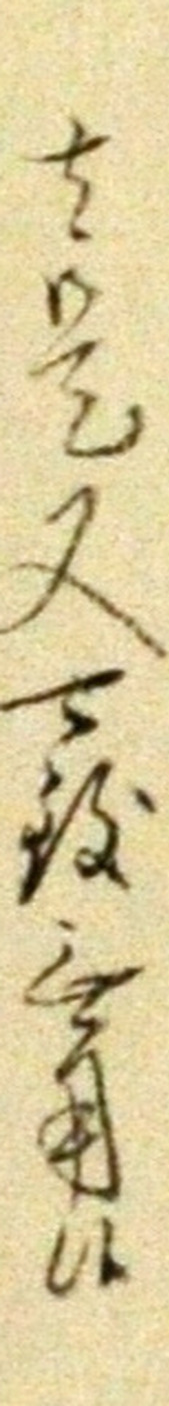は是又可致無用候
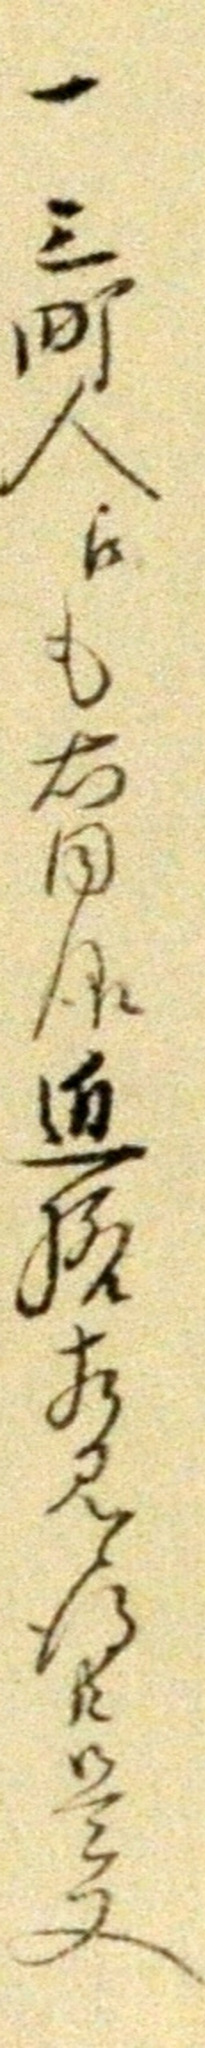一三町人えも右同様近格相見候得共是又
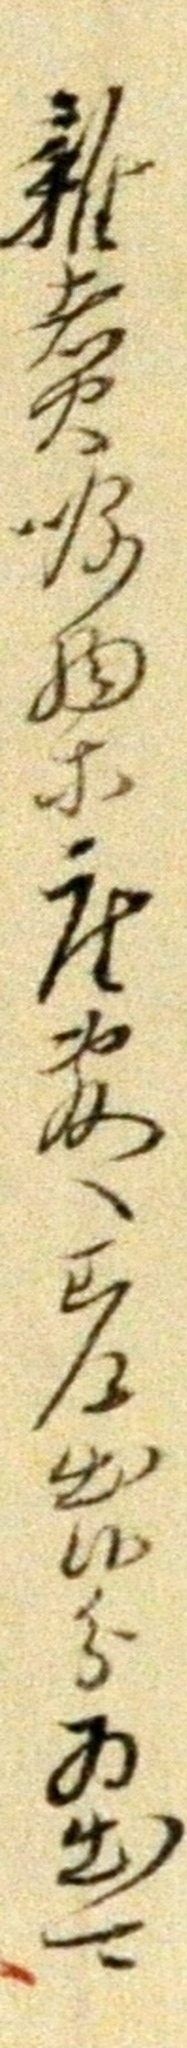雑煮吸物等座敷へ差出候分為出可
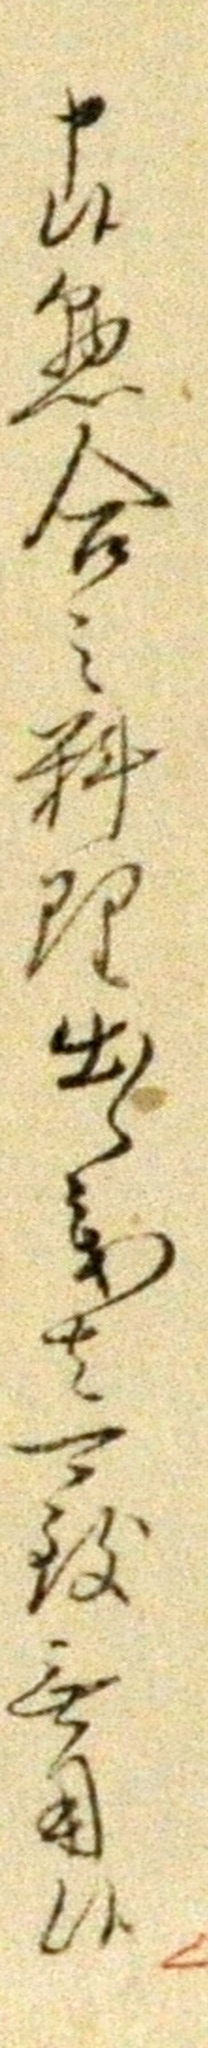申候懸合之料理出候義は可致無用候
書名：大阪加番関係諸書留〔一括〕
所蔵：伊那市立高遠町図書館・合同会社AMANE
